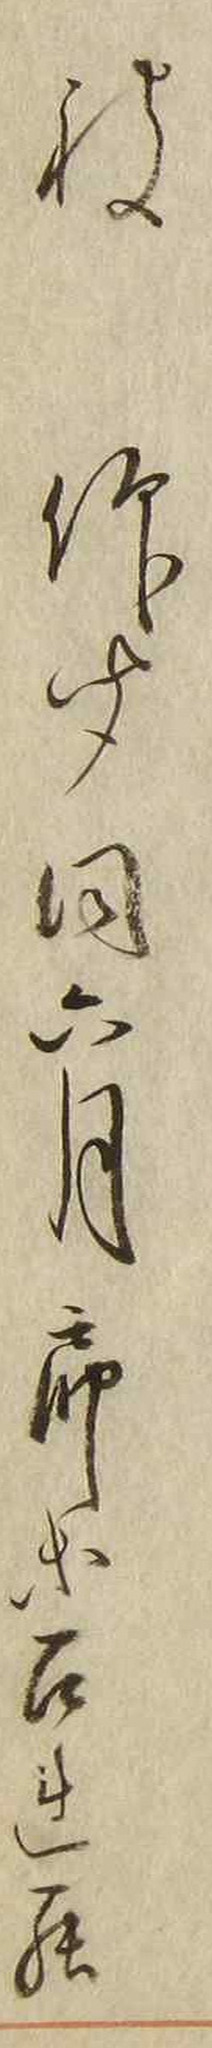被仰聞同六月郎等召連罷

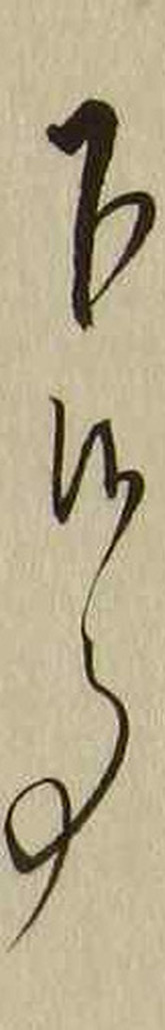下候事
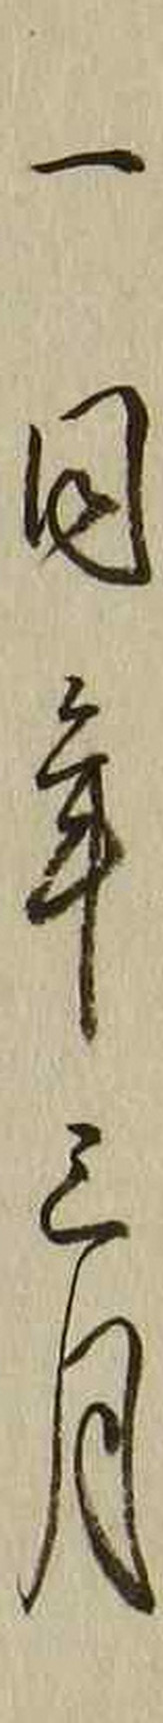一同年三月
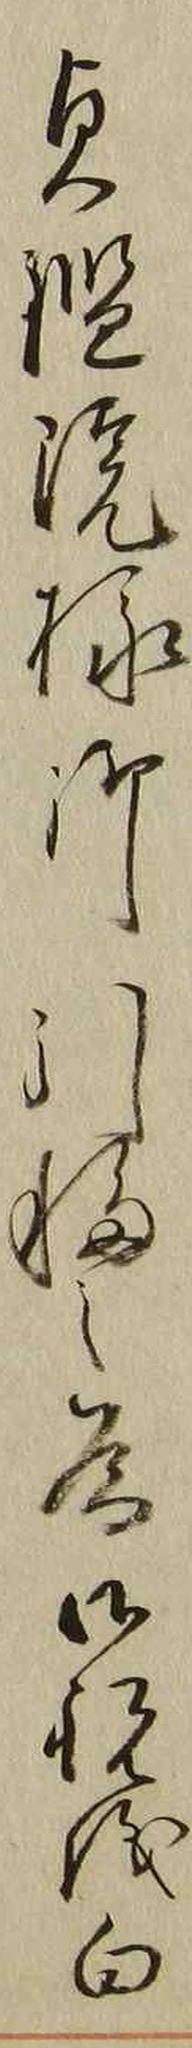貞艦院様御引移之為御祝儀白
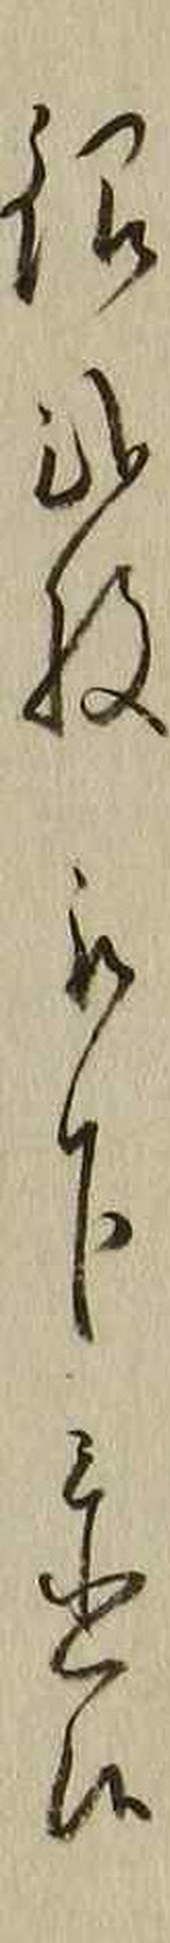銀弐枚被下置候
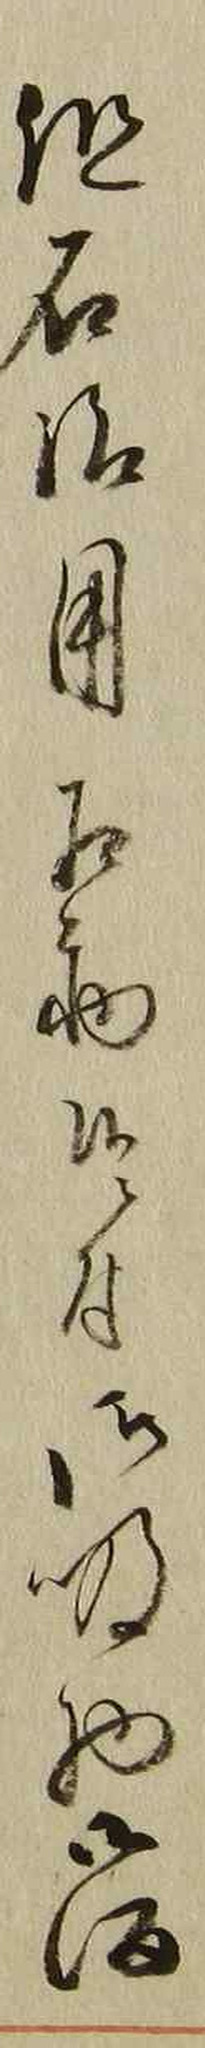但石御用相勤候ニ付御吸物御酒
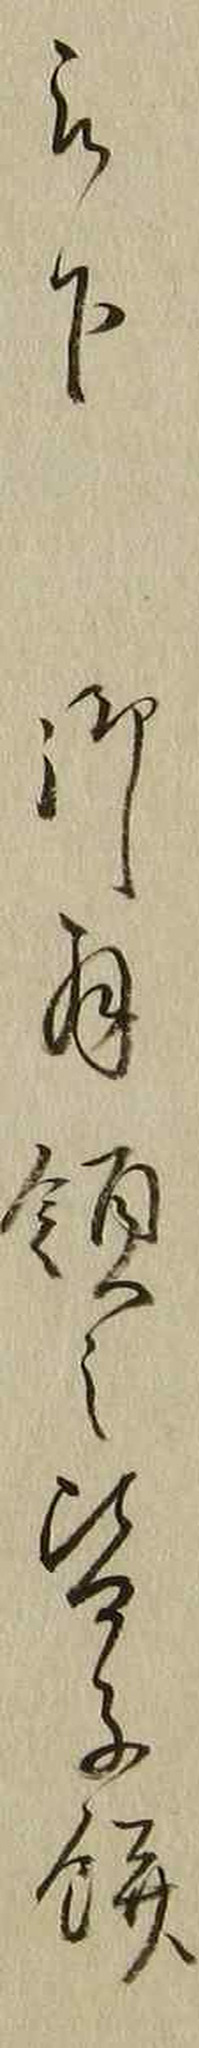被下御拝領之皆子餅
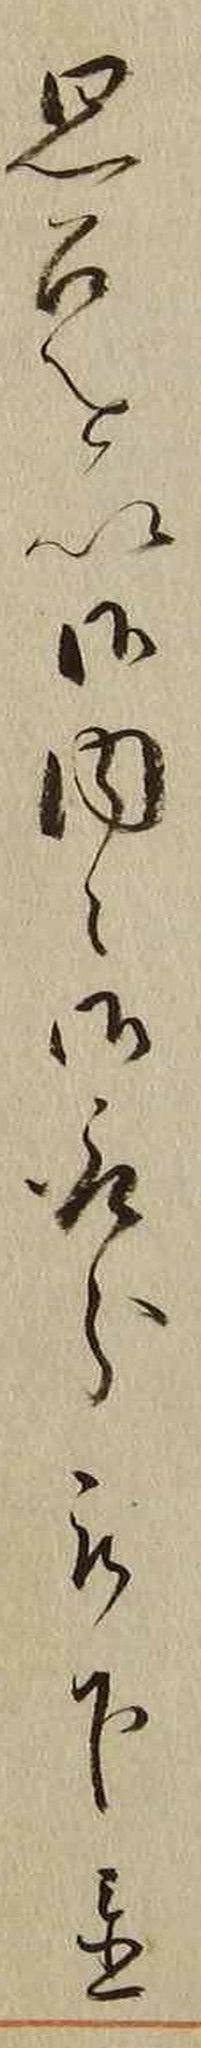思召を以御内々御取分被下置
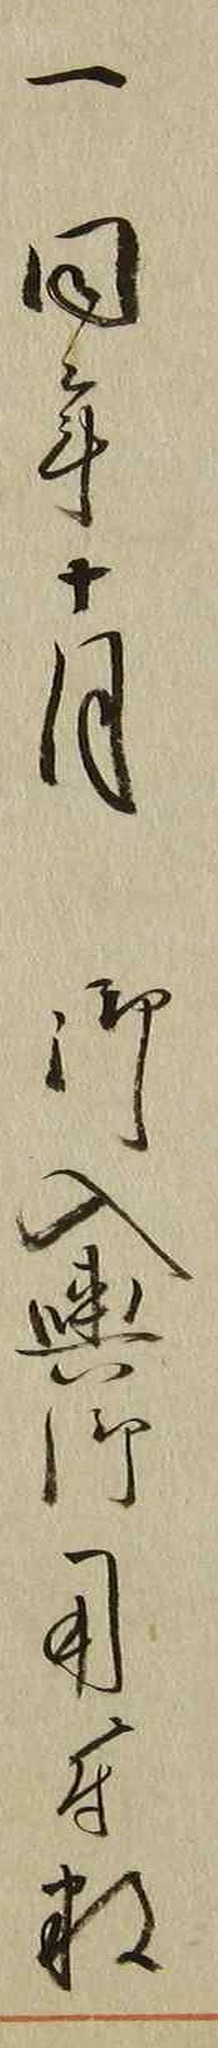一同年十月御入輿御用ニ付数
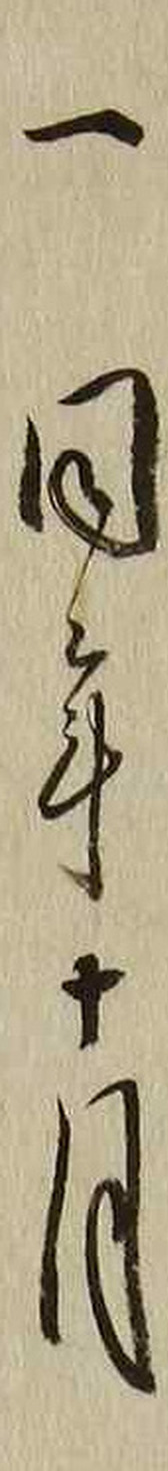一同年三月
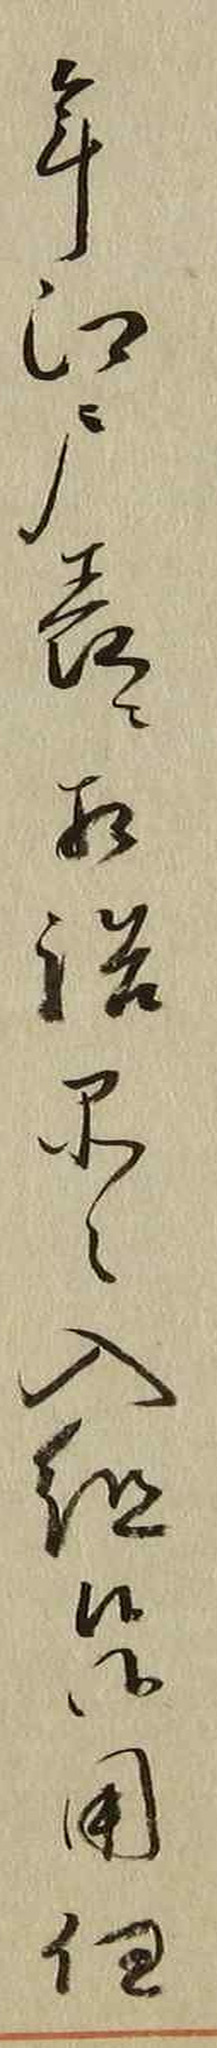年江戸表ニ相詰品々入組候御用任
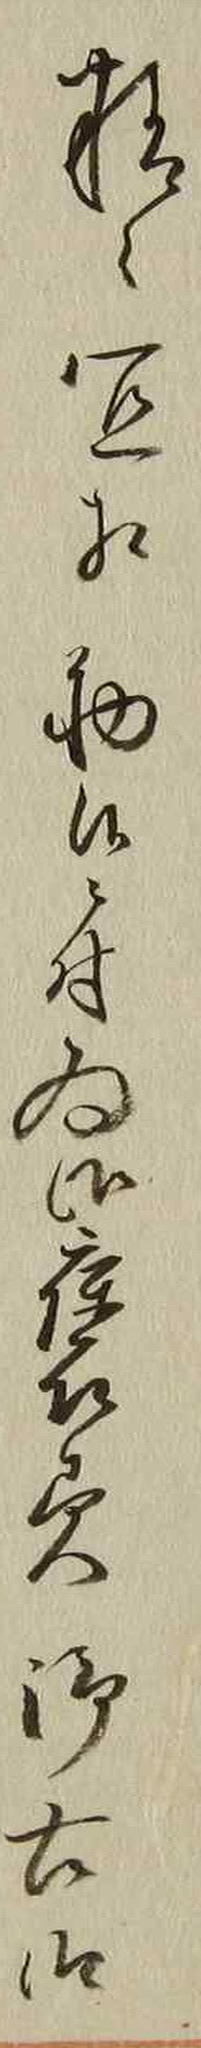精々宜相勤候ニ付為御褒美御古御
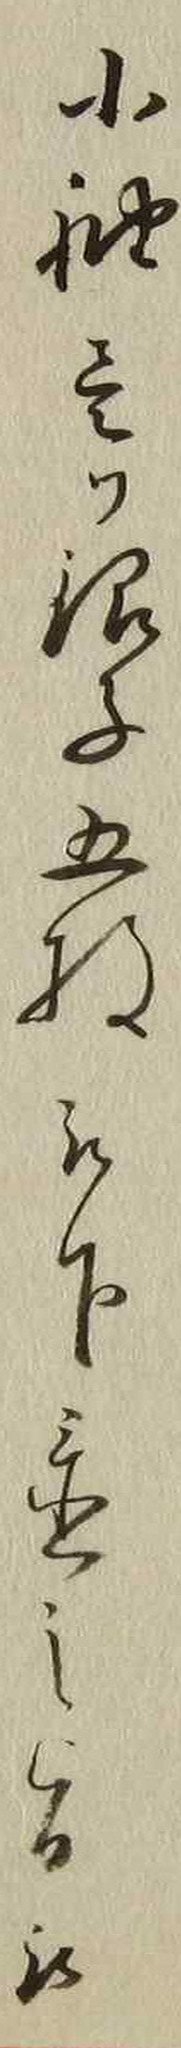小袖壱ツ銀子五枚被下置之旨被
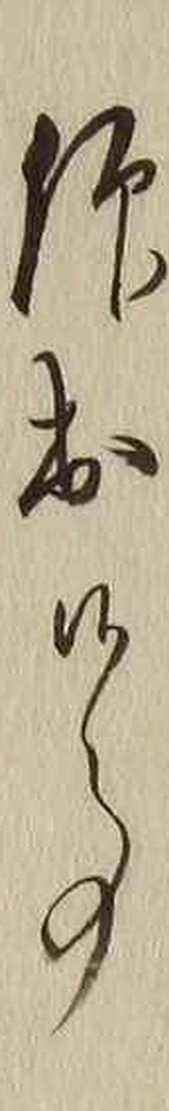仰出候事
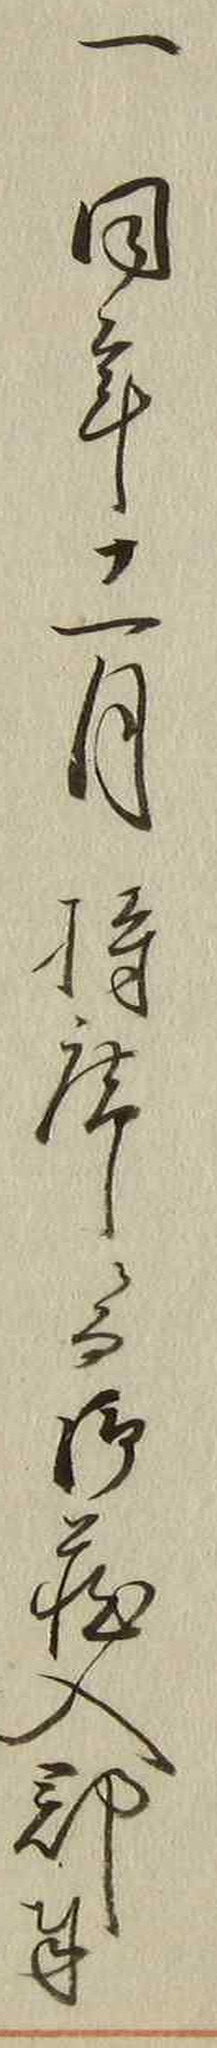一同年二月持席ニ而御蔵入郡奉
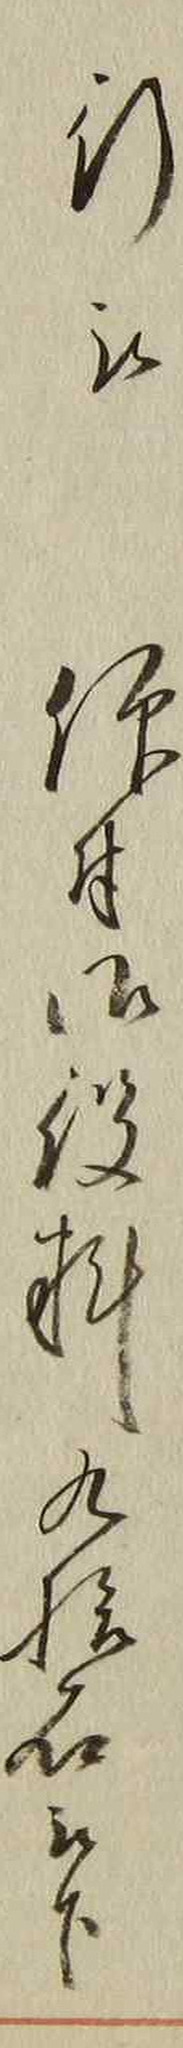行被仰付御役料九拾石被下
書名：諸士系譜　巻之68　を之部2
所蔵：会津若松市立会津図書館
